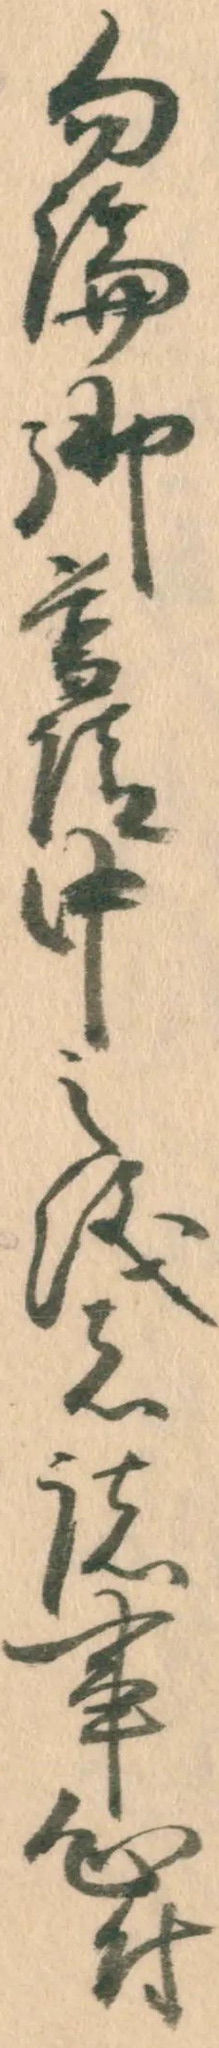勿論御普請中之儀は諸事心付
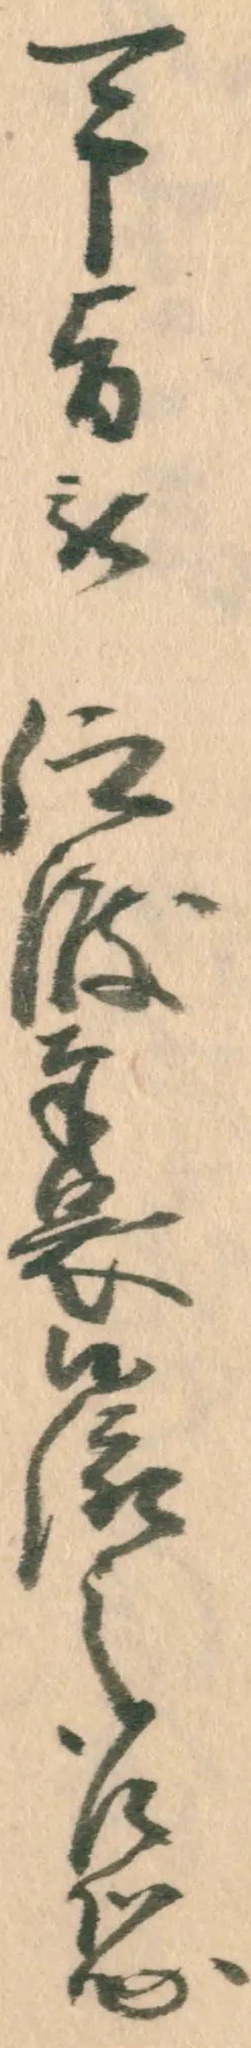可申旨被仰渡奉畏候依之乍恐
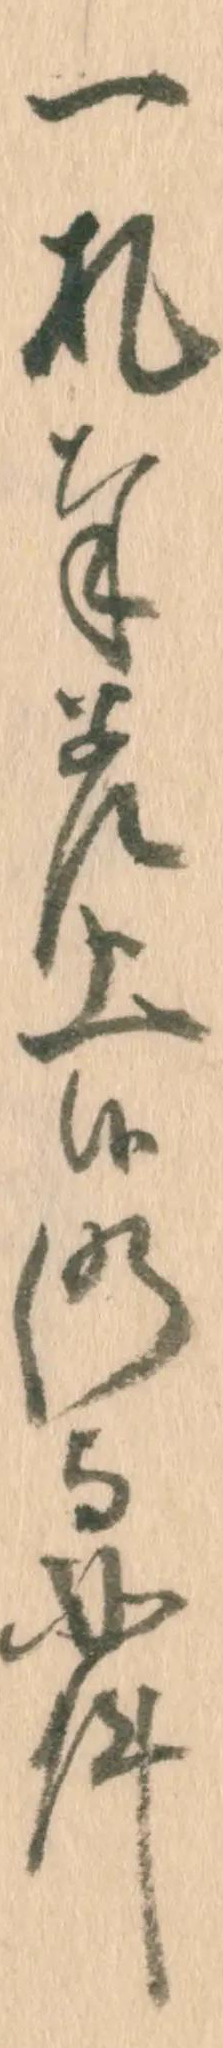一札奉差上候仍て如件
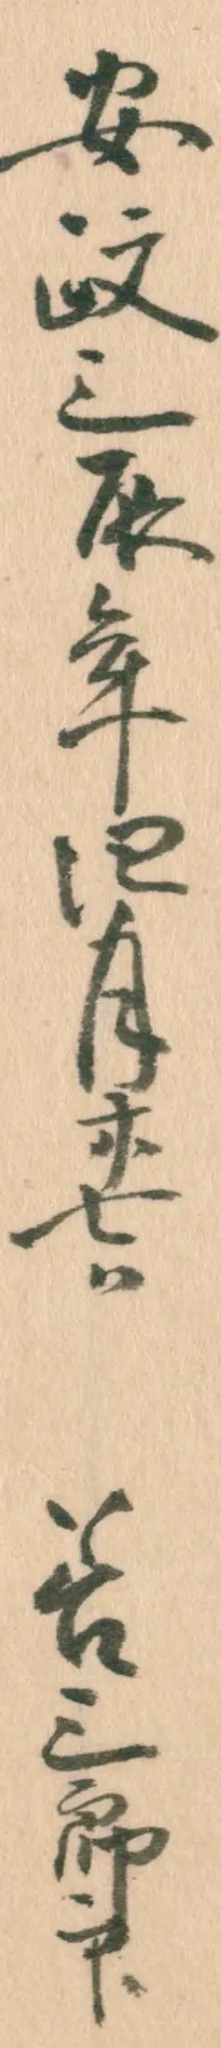安政三辰年四月廿七日善三郎印
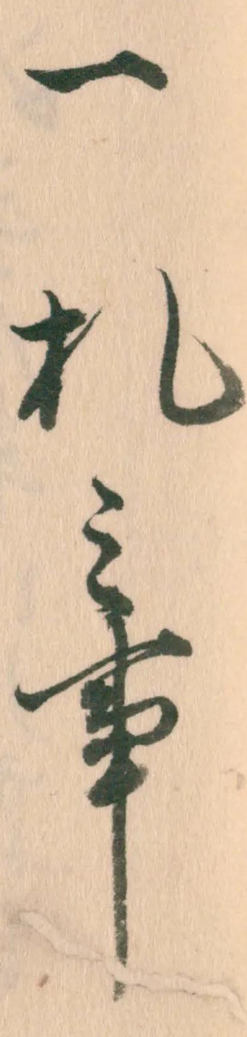一札之事
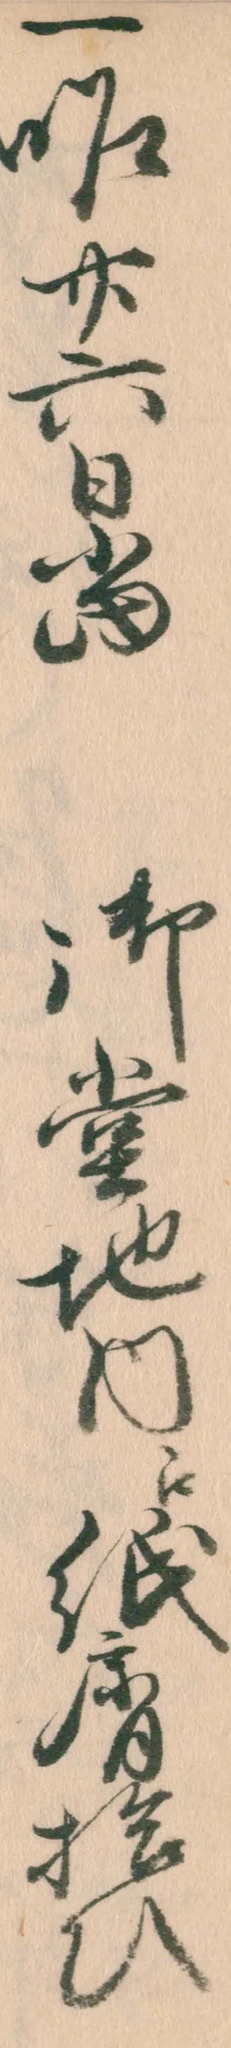一昨廿六日当御堂地内え紙屑拾ひ
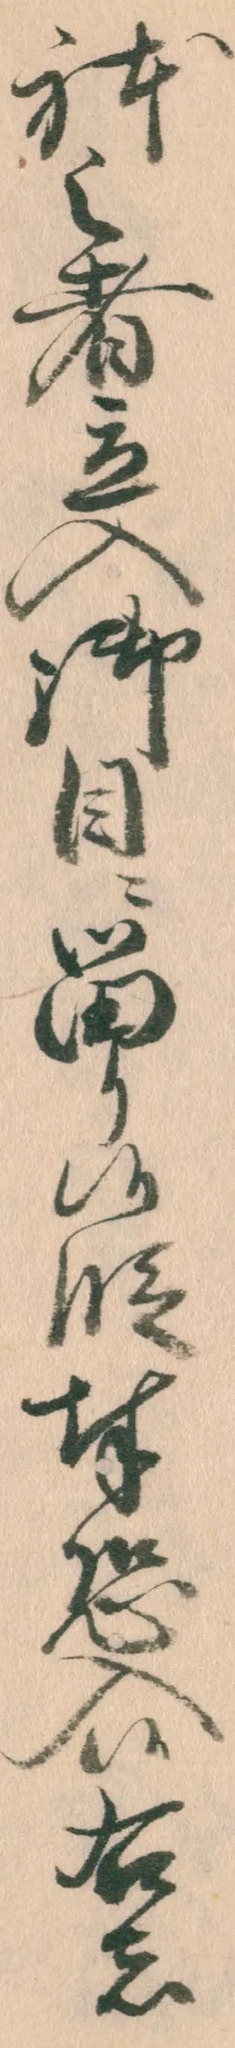体之者立入御目ニ留り候段奉恐入候右は
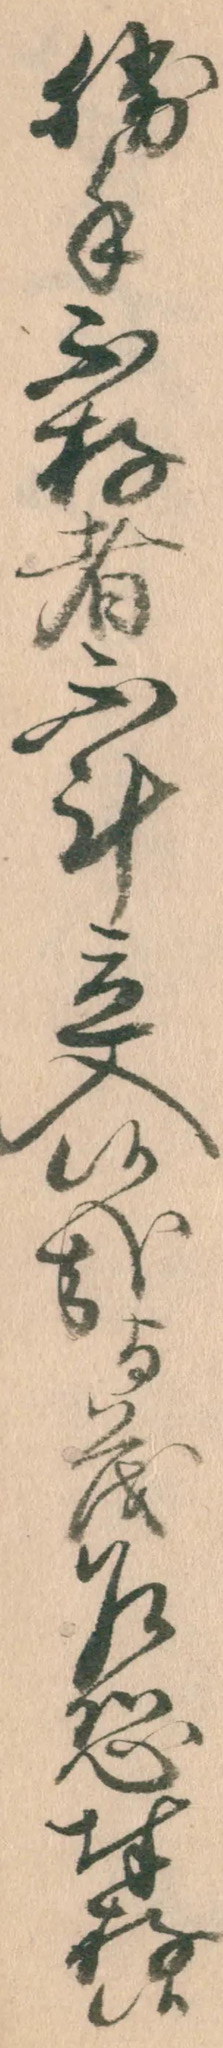勝手不存者ふと立入候哉とも乍恐奉存候

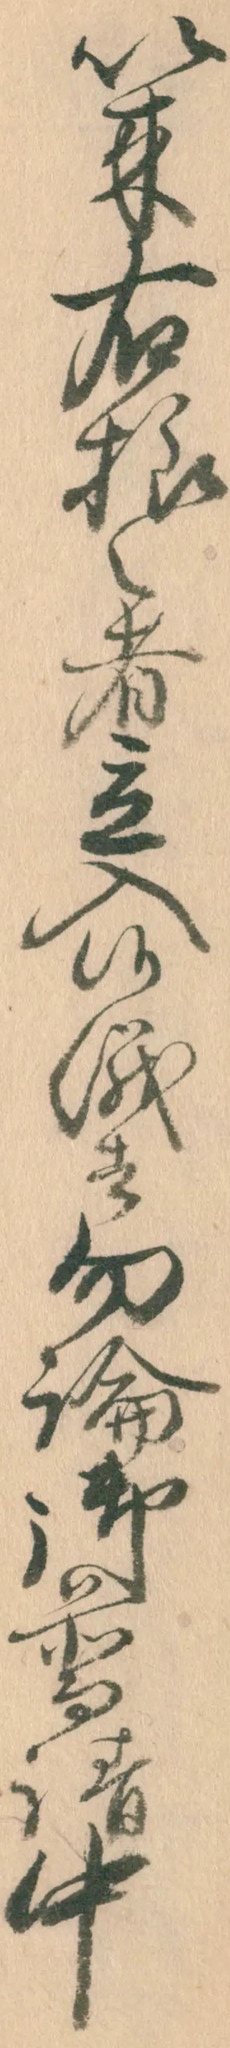以来右様之者立入候儀は勿論御普請中
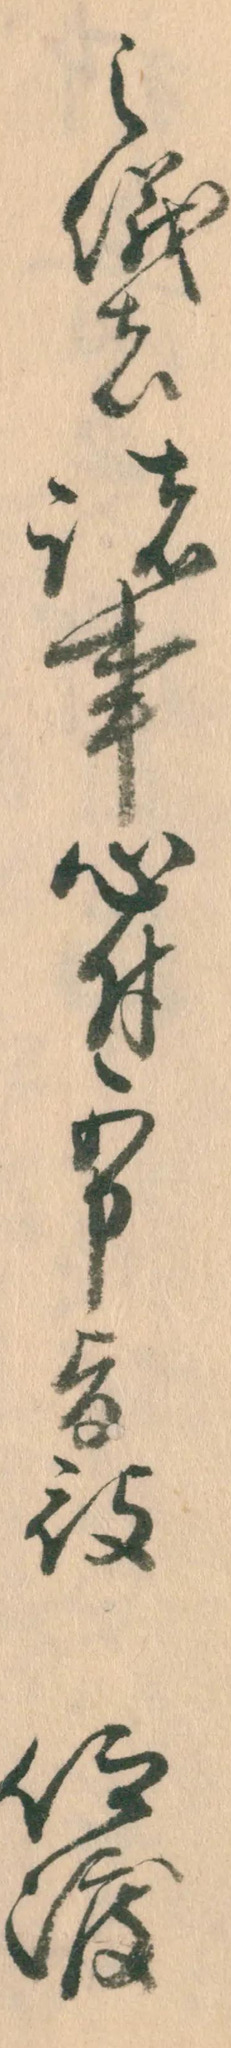之儀は諸事心付可申旨被仰渡
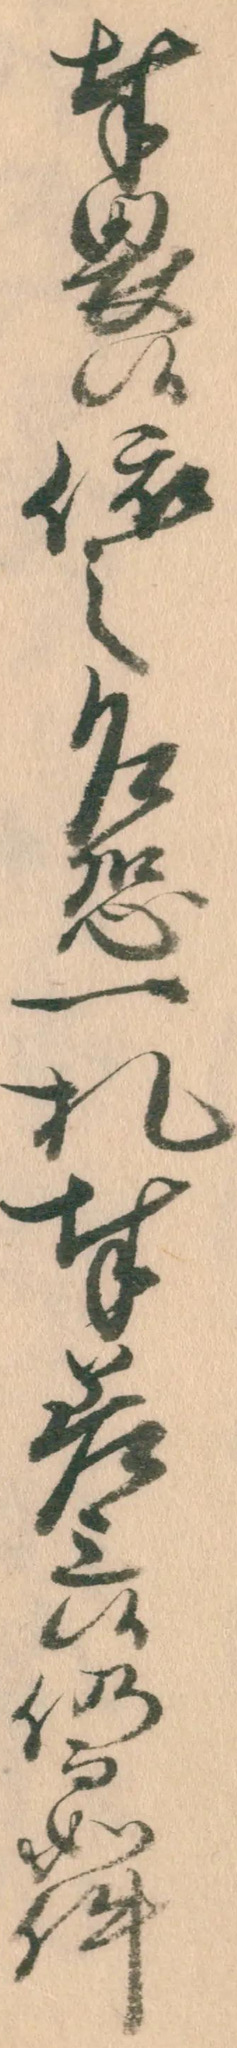奉畏候依之乍恐一札奉差上候仍て如件
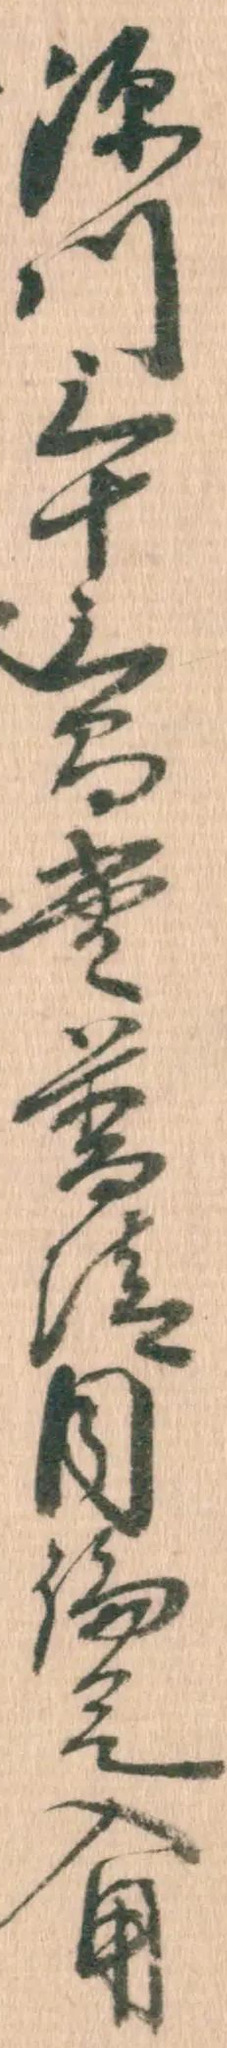│深川三十三間堂普請目論見入用
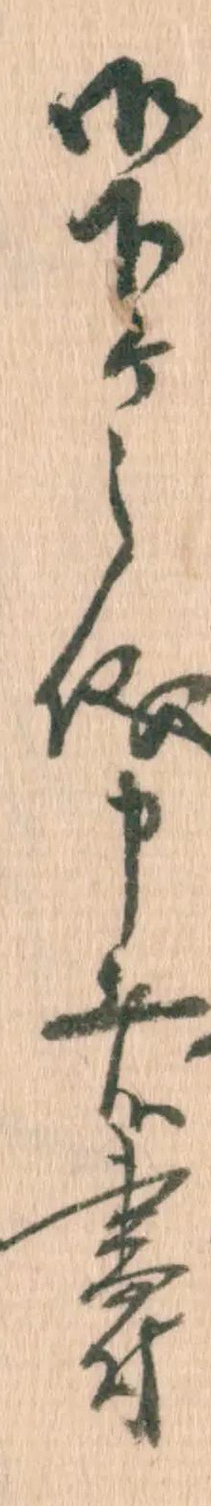│御下ケ之儀申上候書付
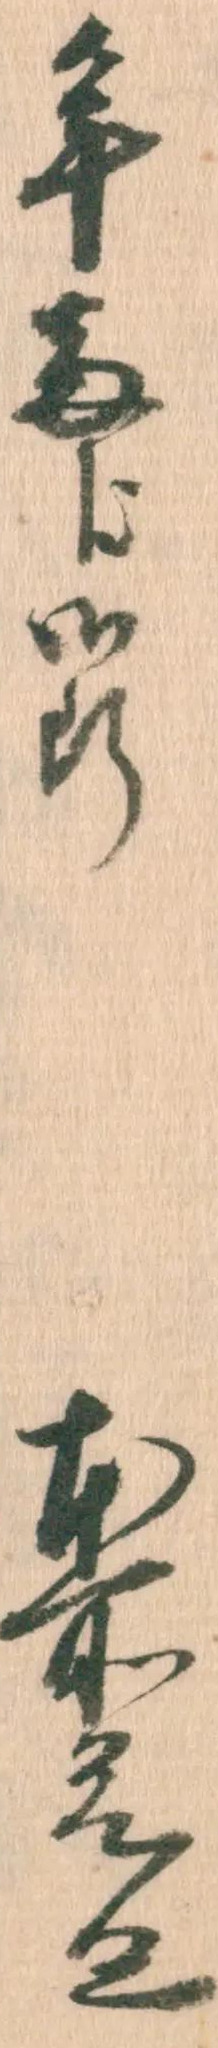│年番え御断本所見廻
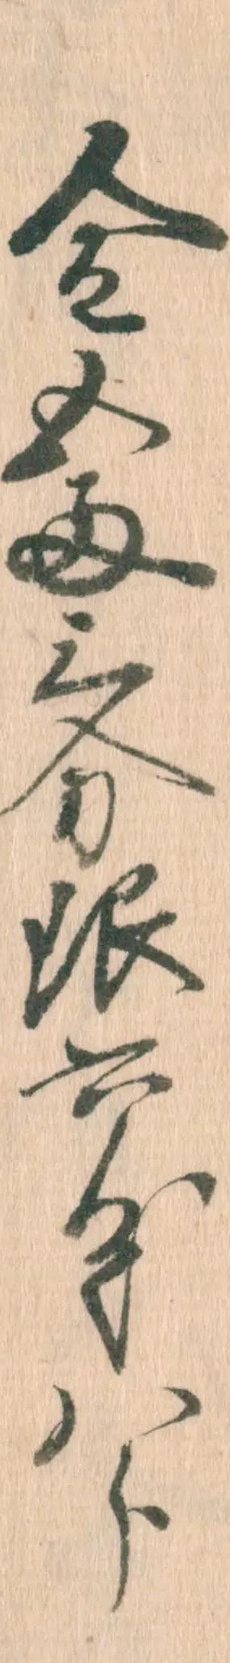一金五両三分銀六匁八分
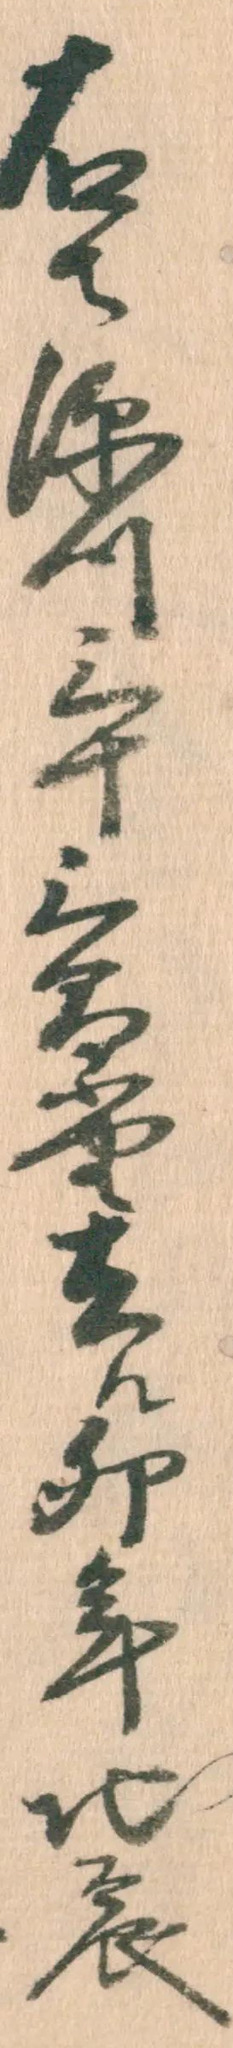右は深川三十三間堂去ル卯年地震
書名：三十三間堂. [2]
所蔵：国立国会図書館 National Diet Library, JAPAN
